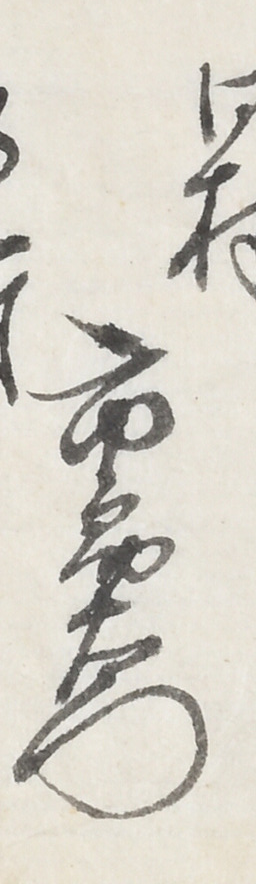市郎右衛門
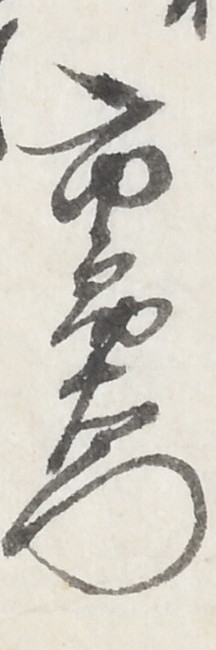市郎右衛門
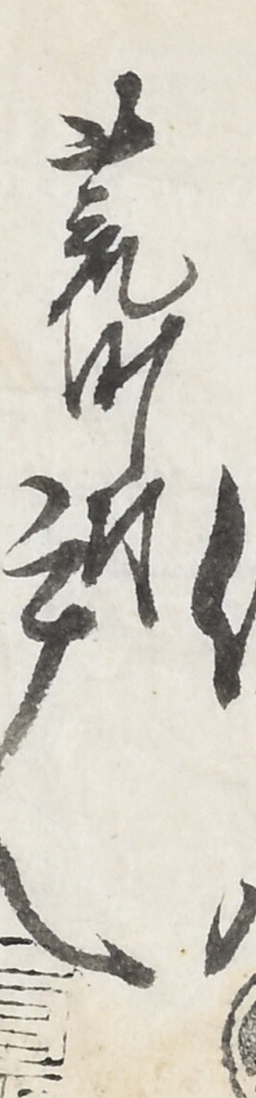荒町村
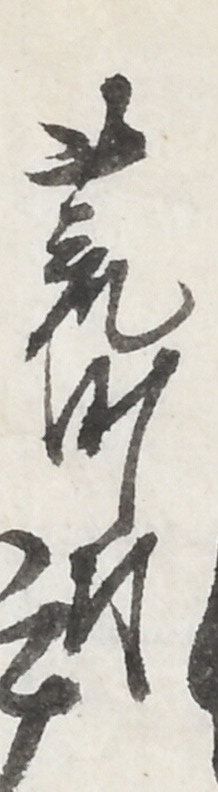荒町村

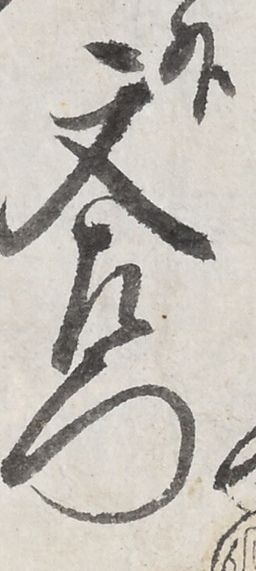文左衛門
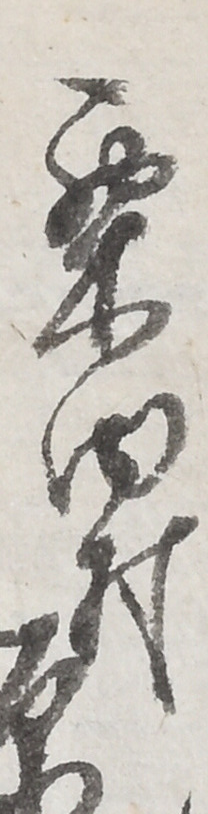栗田村
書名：高遠御領分鍛冶相定帳
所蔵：伊那市立高遠町図書館・合同会社AMANE
